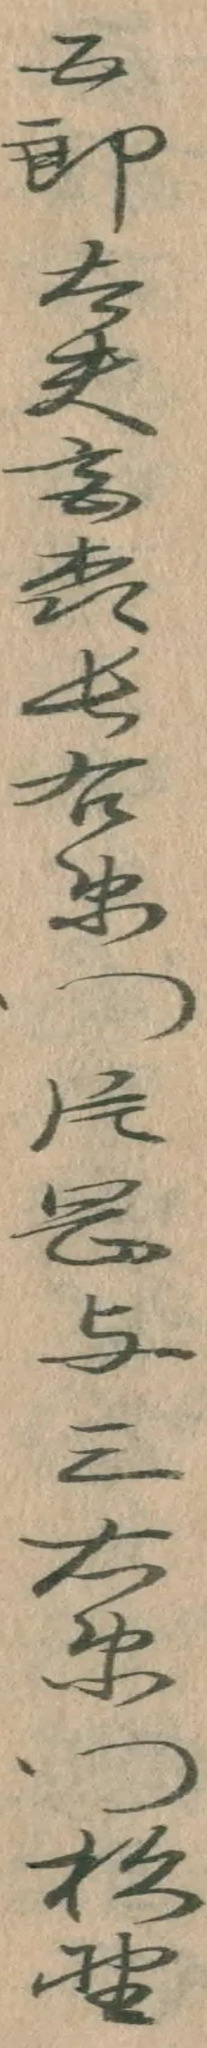五郎太夫宮森長右衛門片岡与三右衛門杉野
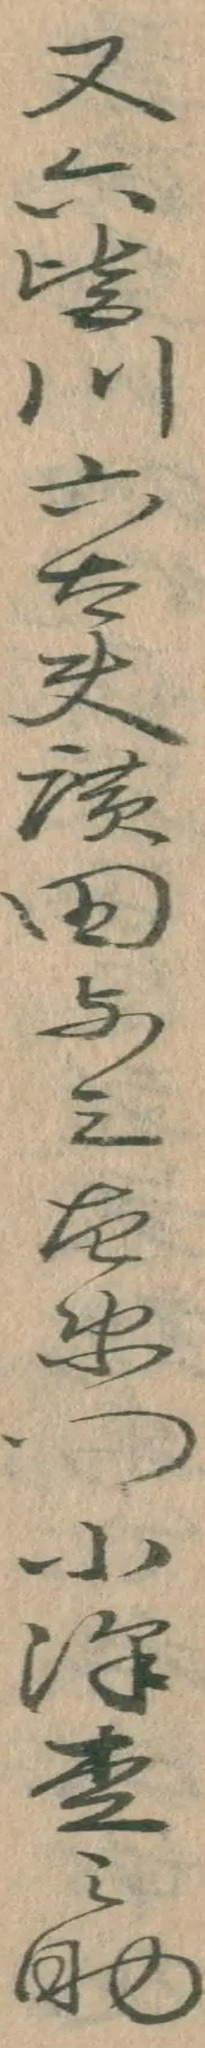又六皆川六太夫広田与三左衛門小沢杢之助
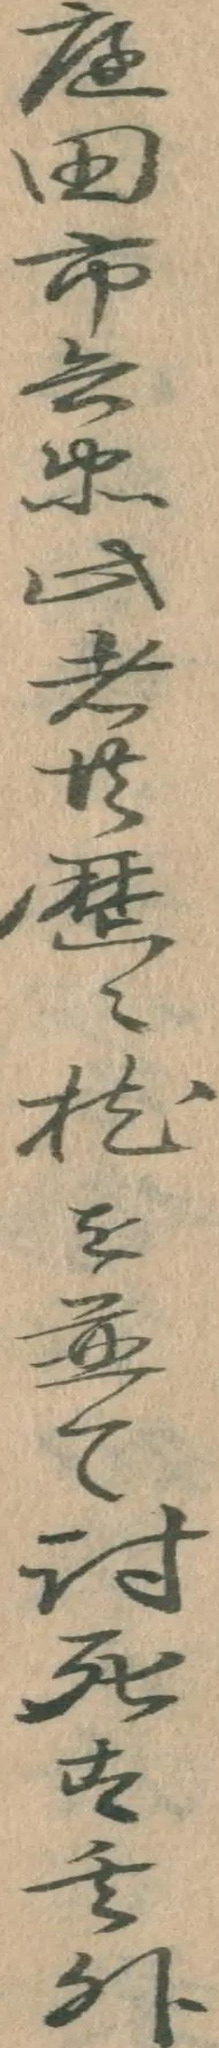庭田市兵衛此者共歴々枕を並て討死春其外
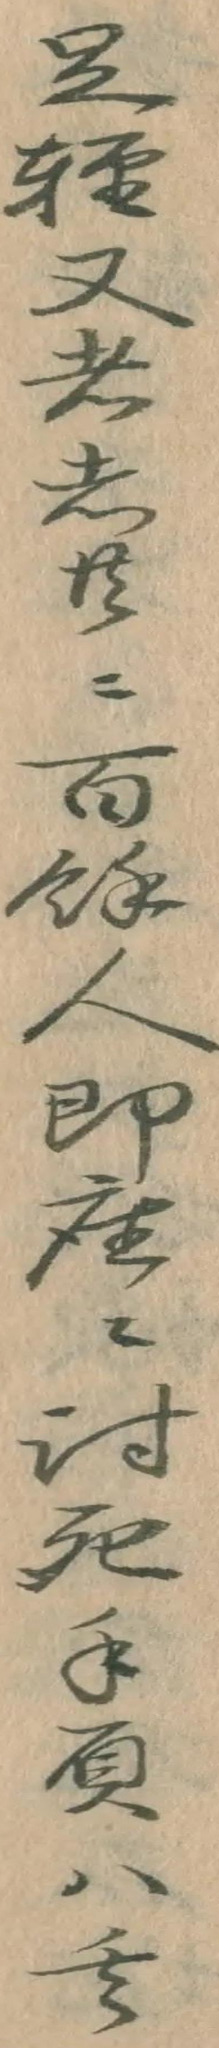足軽又者者共に百余人即座に討死手負は其

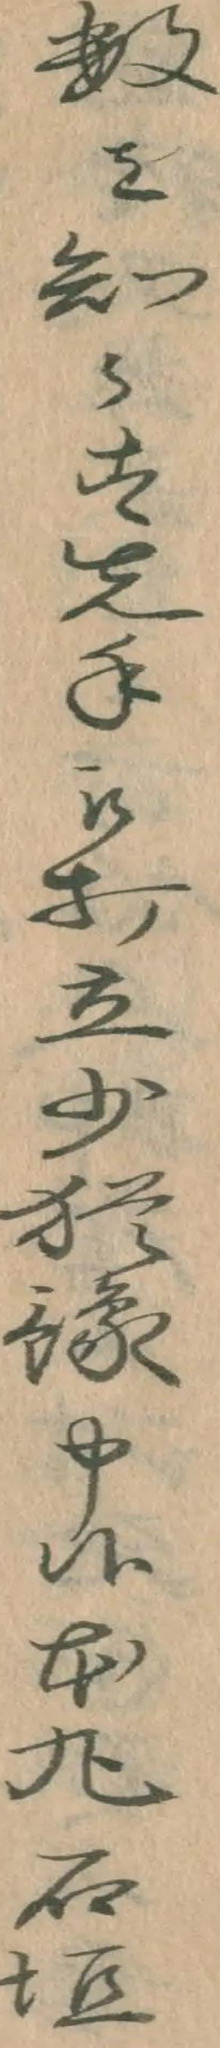数を知ら春先手被打立少猶予申候本丸石垣
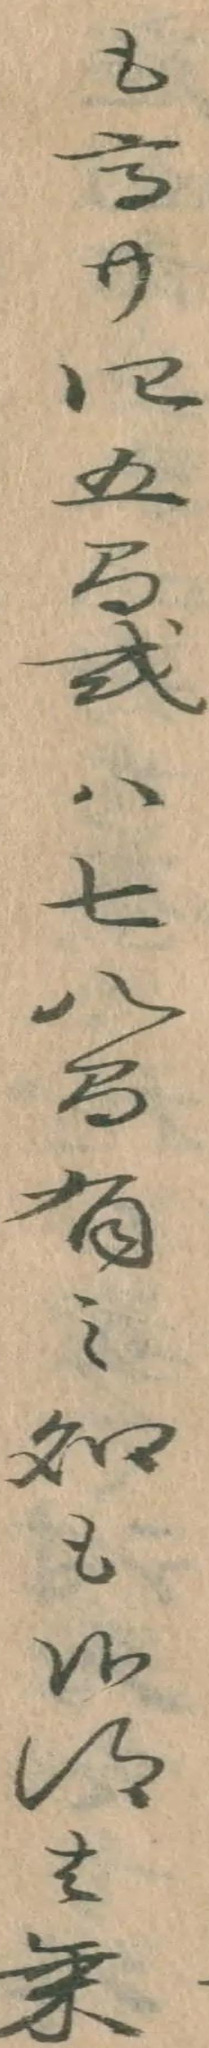も高さ四五間或は七八間有之処も候得者乗
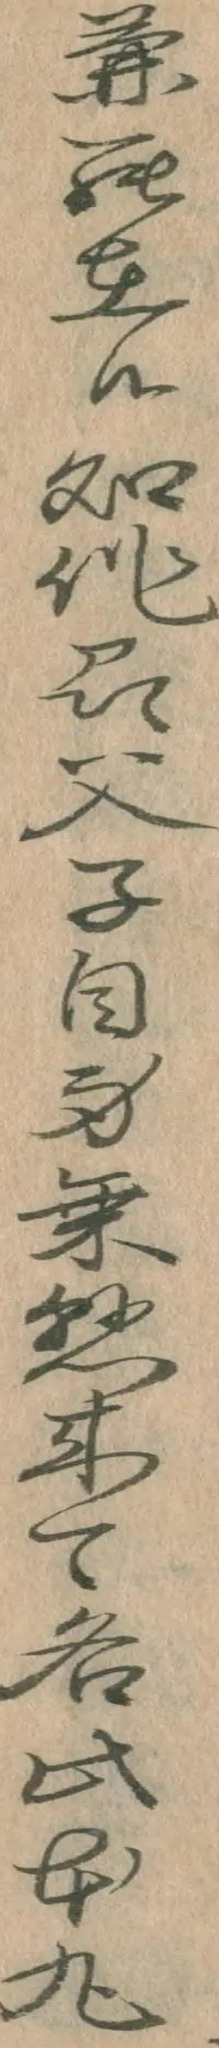兼罷在候処作州父子自身乗懸来て各此本丸
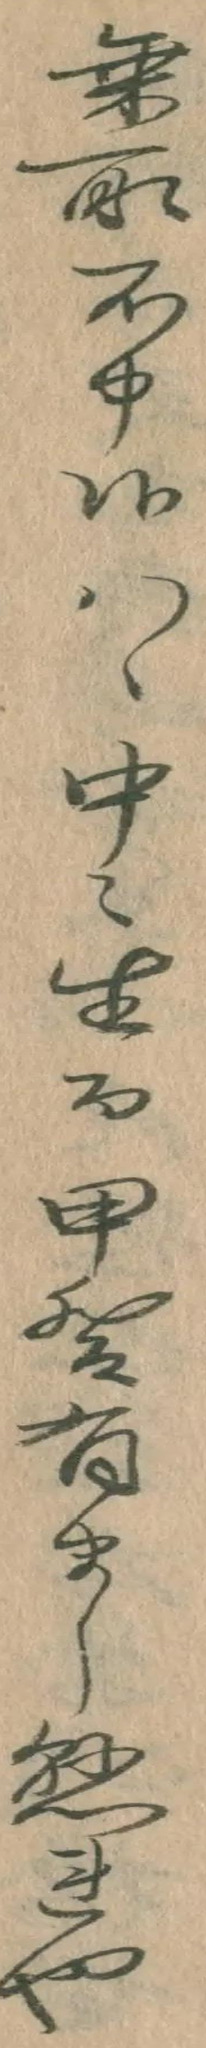乗取不申候はゝ中に生而甲斐有まし懸連や
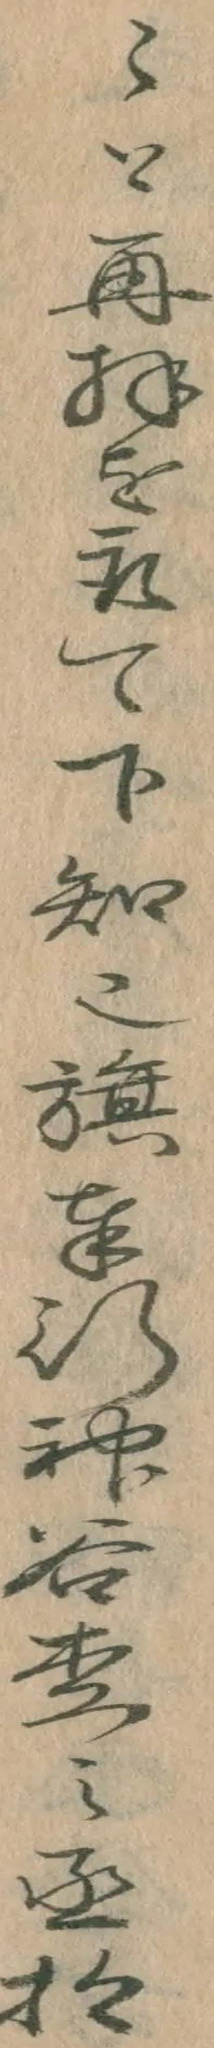ゝと再拝を取て下知也旗奉行神谷杢之丞拾
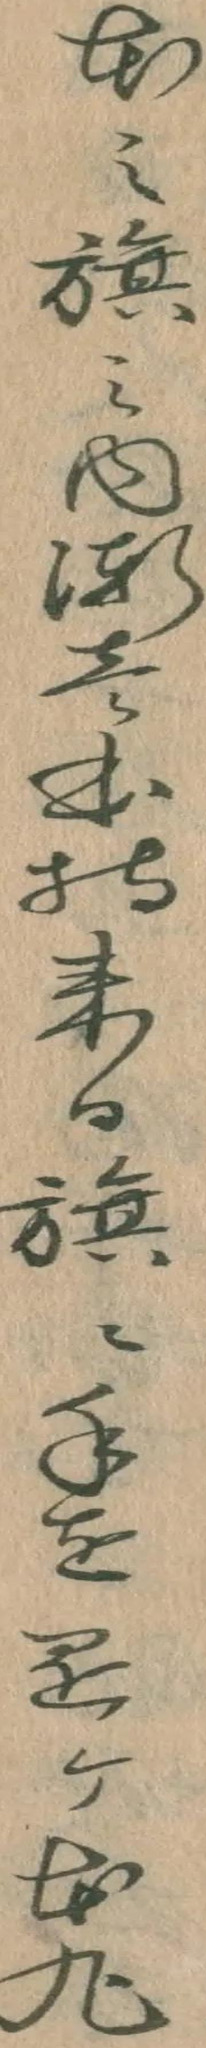本之旗之内瀬壱本持参る旗に手を懸け本丸
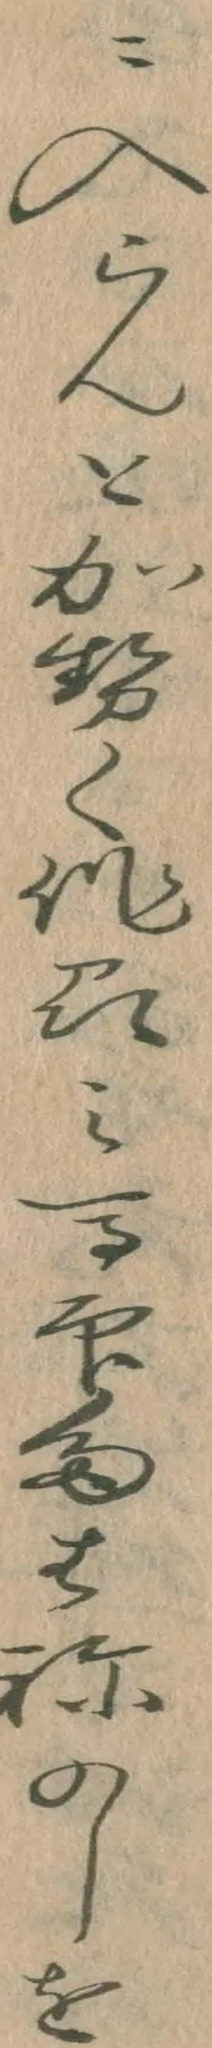に入らんと加勢く作州之馬印多者祢のしを
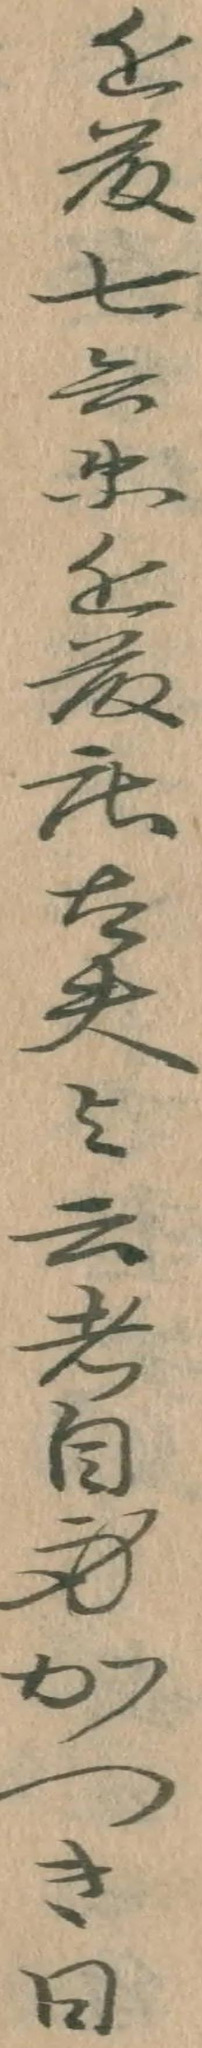近藤七兵衛近藤庄太夫与云者自身かつき日
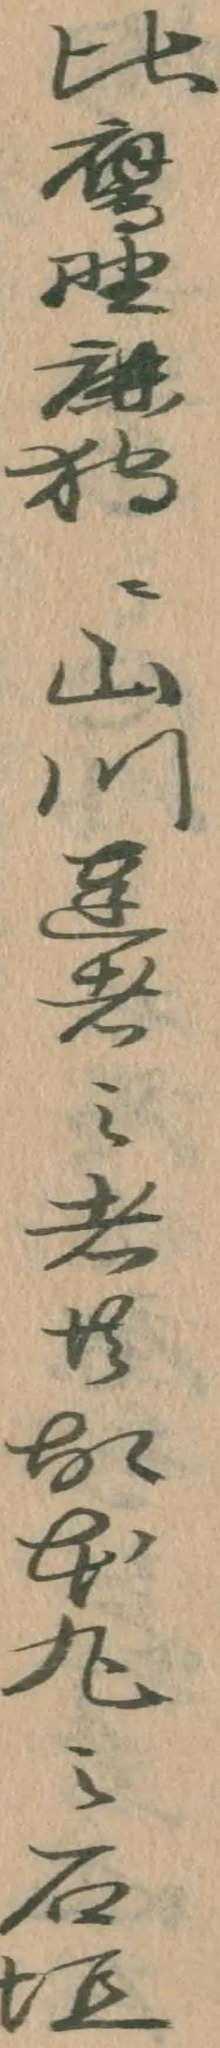比鷹野廉狩に山川達者之者共故本丸之石垣
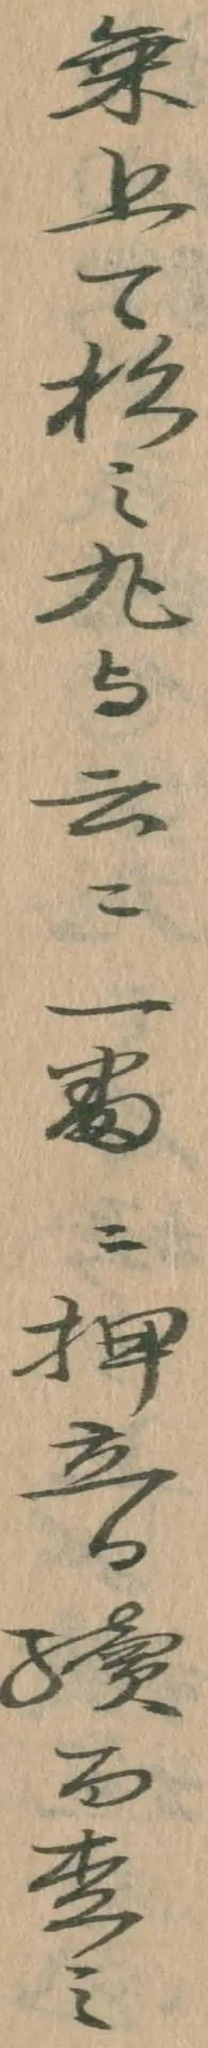乗上て杉之丸与云に一番に押立る続而杢之
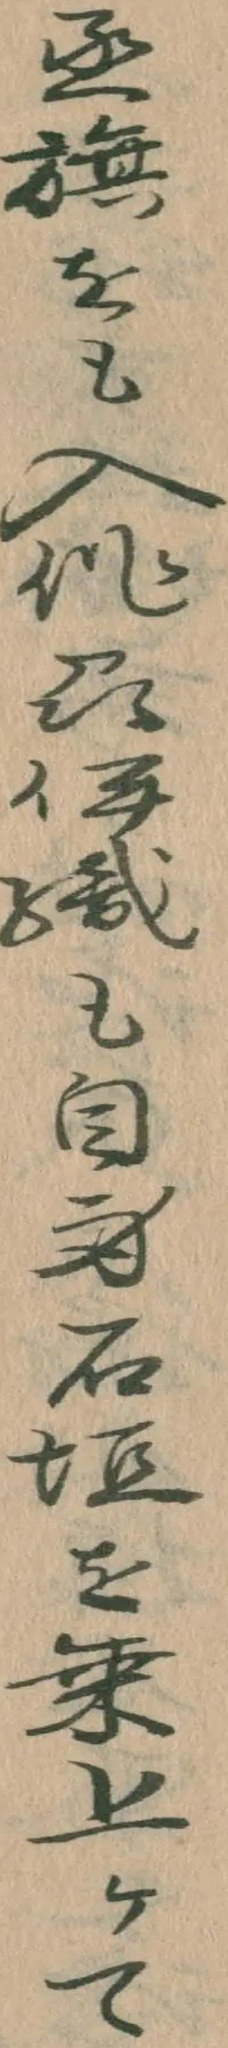丞旗をも入作州伊織も自身石垣を乗上けて
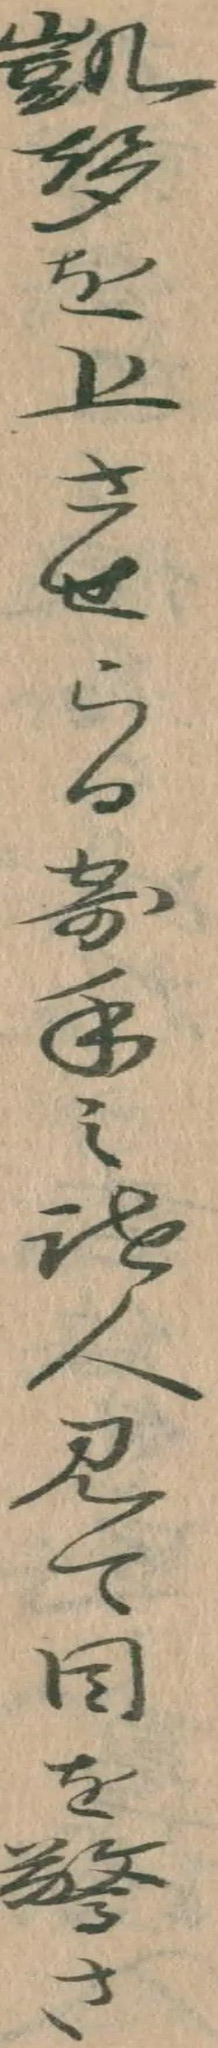凱声を上させらる寄手之諸人見て目を驚さ
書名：切支丹御退治記 49巻. [7]
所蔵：国立国会図書館 National Diet Library, JAPAN
